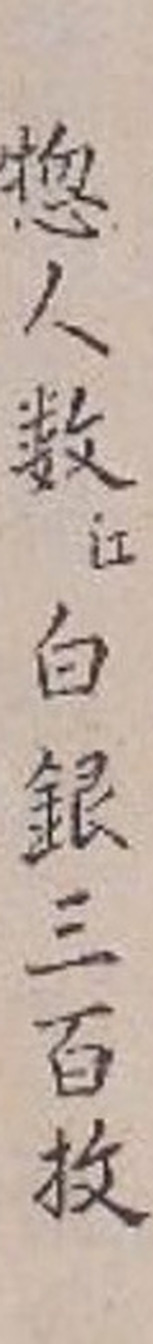惣人数え白銀三百枚
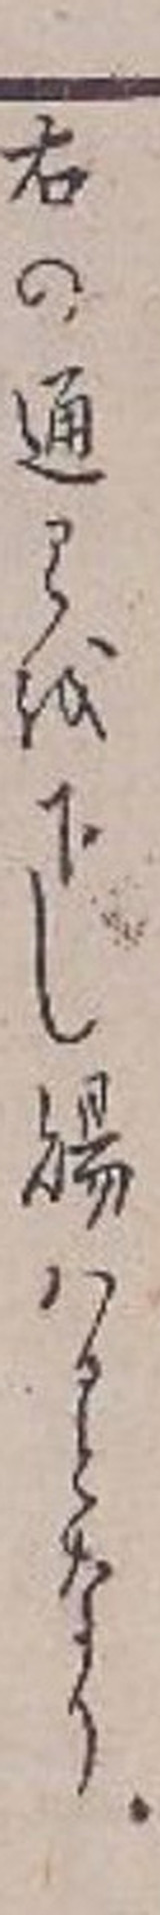右の通りを下し賜はるとなり、
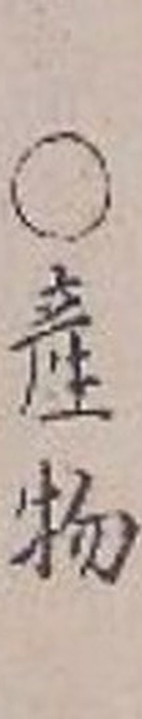○産物
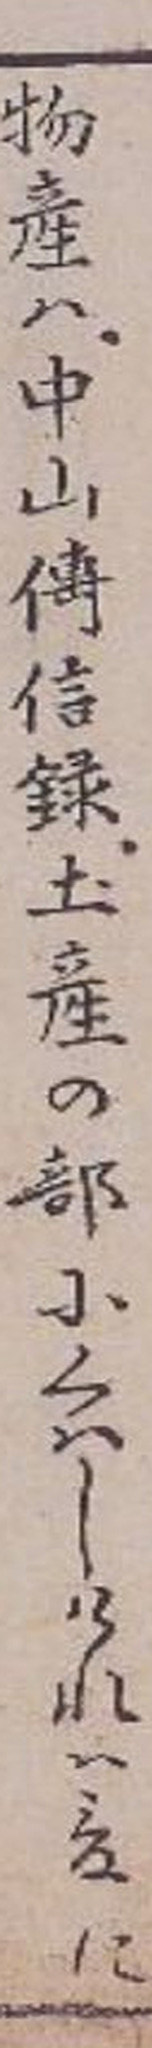物産は、中山伝信録、土産の部にくはしけれは爰に
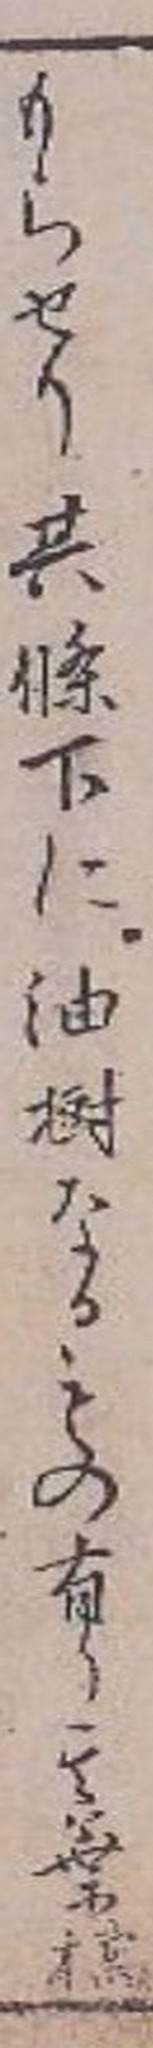もらせり、其条下に、油樹なるもの有り其葉橘
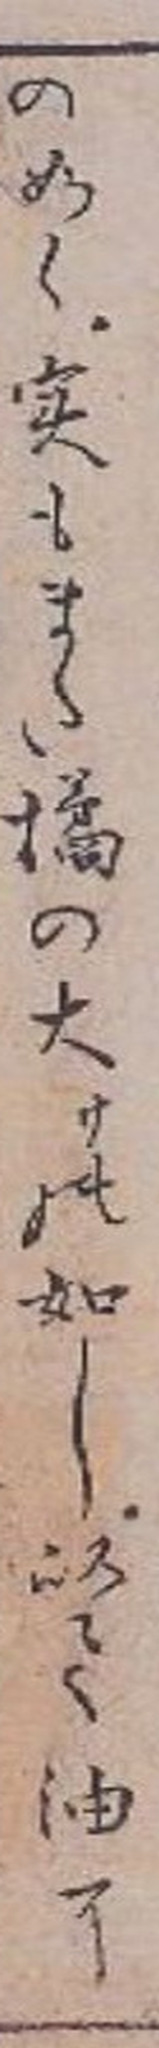の如く、実もまた橘の大の如し、以て油に

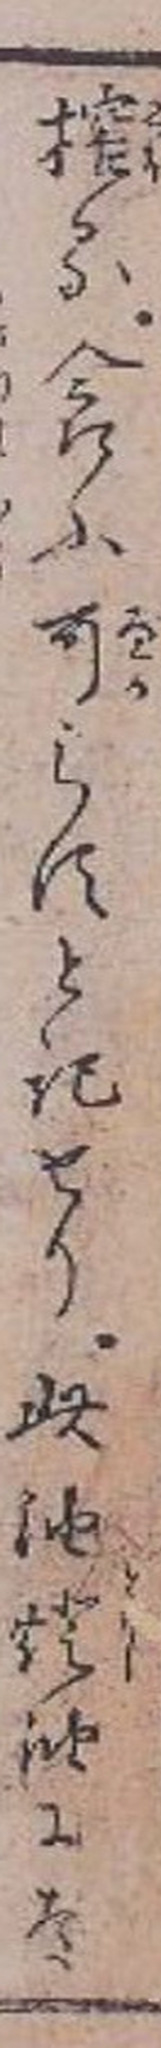搾る、食ふ可らすと記せり、此油灯油にな
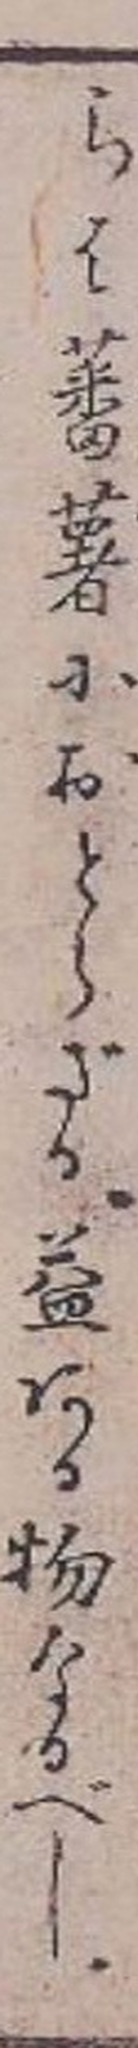らは、蕃薯におとらざる、益ある物なるべし、
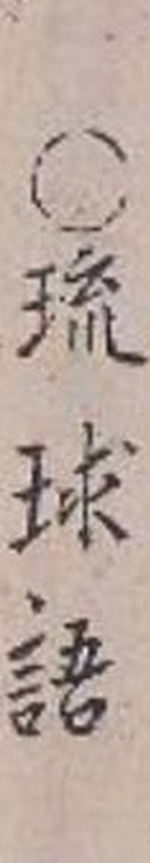○琉球語
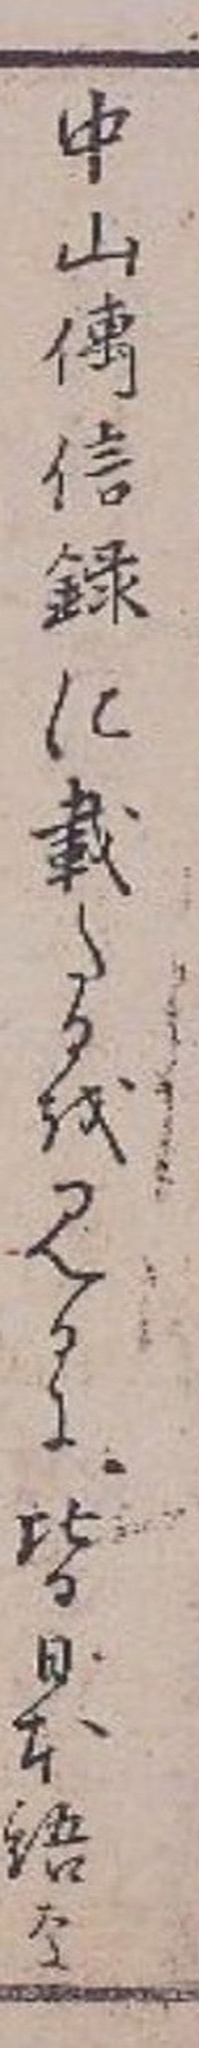中山伝信録に載たるを見るに、皆日本語な
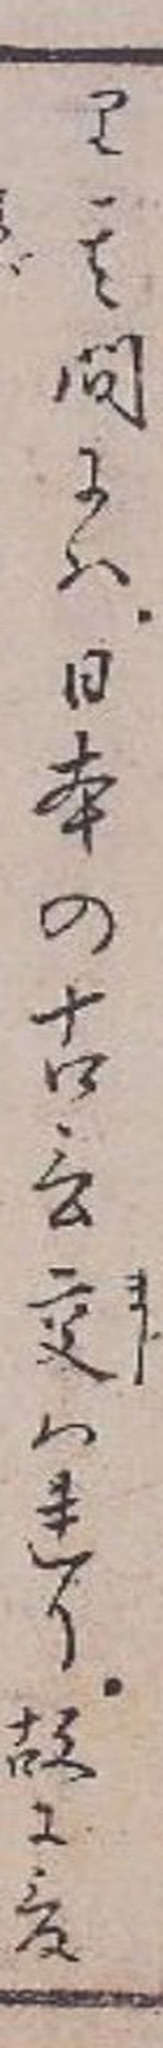り其間には、日本の古言交はれり、故に爰
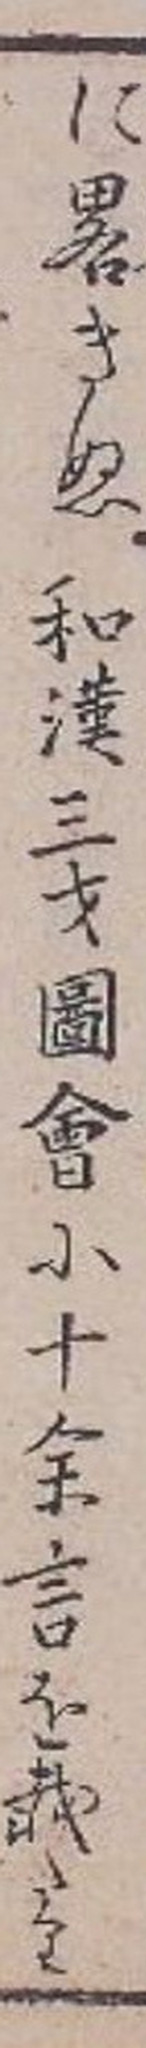に略きぬ、和漢三才図会に十余言を載たり
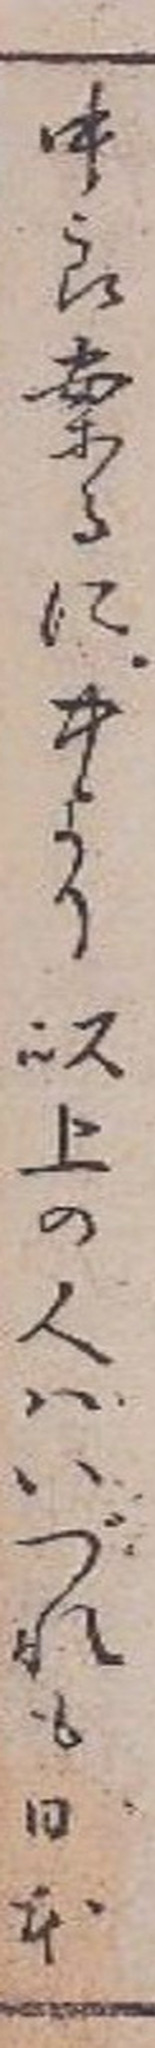中良案るに、中より以上の人はいづれも日本
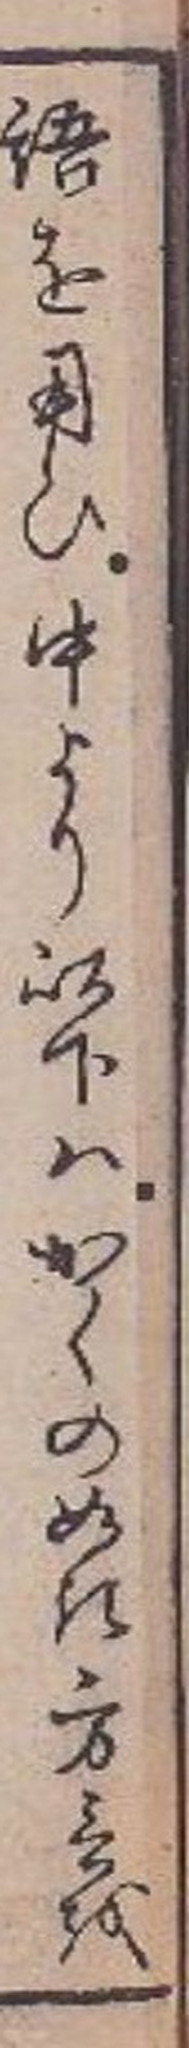語を用ひ、中より以下は、かくの如き方言を
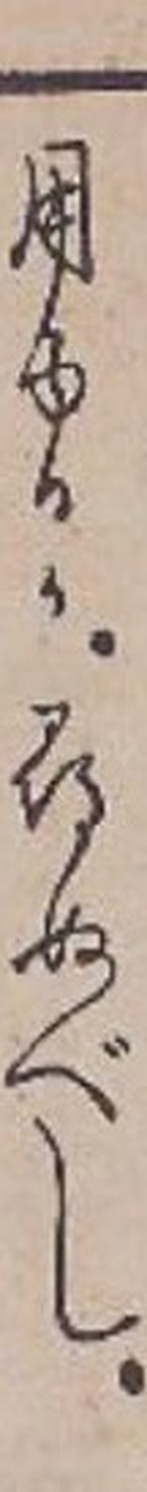用ゆるか、尋ぬべし、
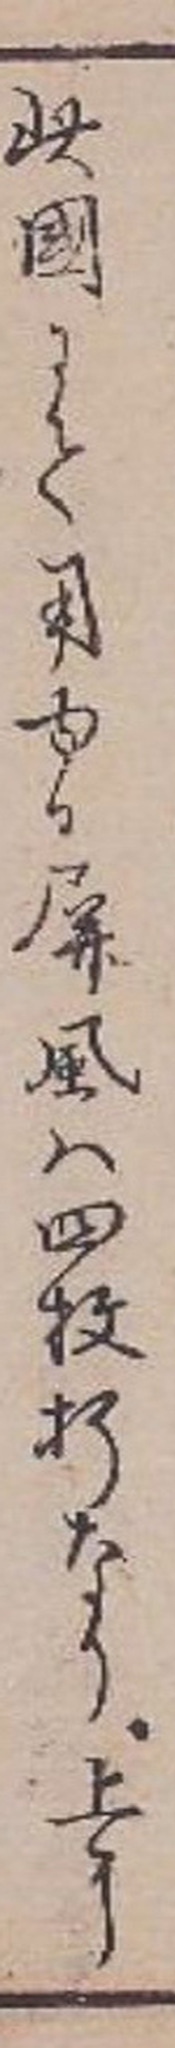此国にて用ゆる屏風は四枚折なり、上に
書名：琉球談
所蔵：University of the Ryukyus Library
